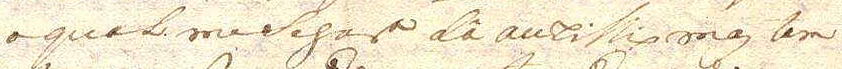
o qual me segura dâ auzillio mas tam
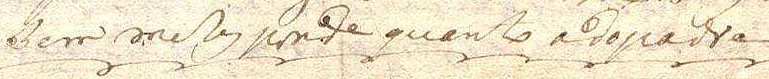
bem me Responde quanto a do padre
